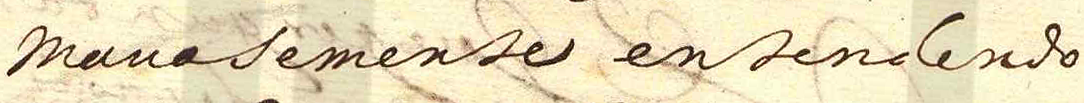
maua semente entendendo
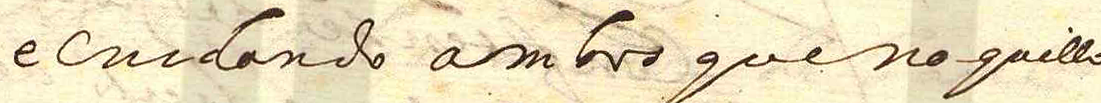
e cuidando ambos que naquillo
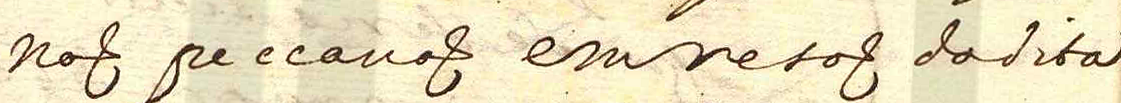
não peccauão em resão da dita
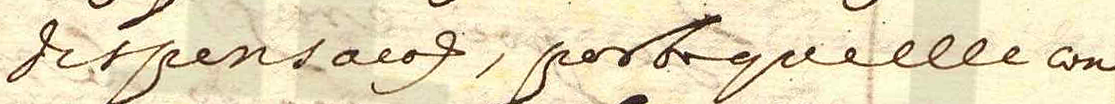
dispensacaõ, posto que elle con
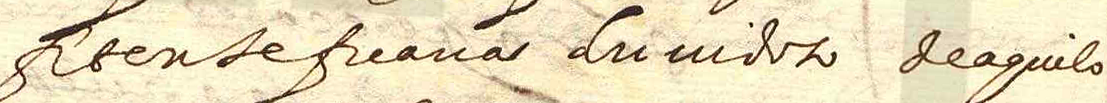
fitente ficaua duuidozo de aquilo
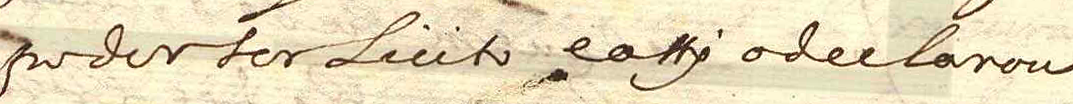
poder ser Licito e assy o declarou
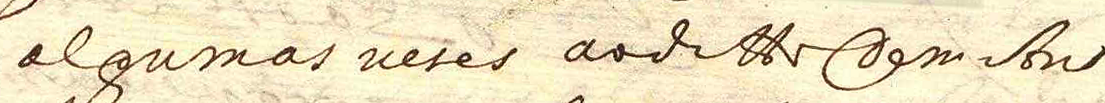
algumas ueses ao ditto Dom An
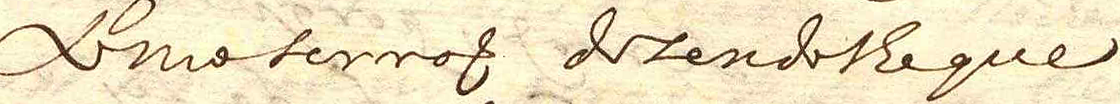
tonio serraõ dizendolhe que
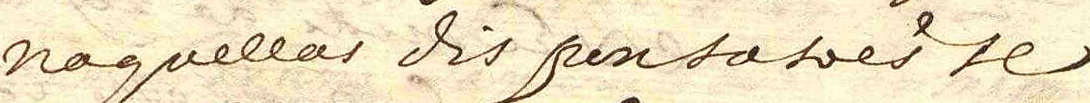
naquellas dispensasoes̄ se
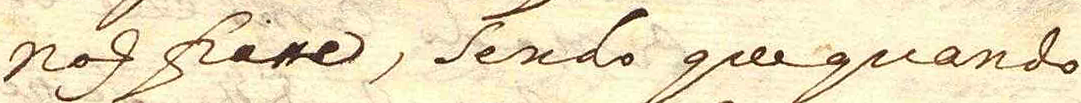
naõ fiasse, sendo que quando
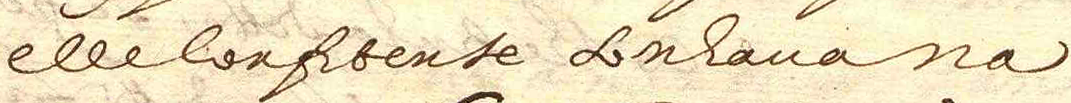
elle confitente sonhaua na
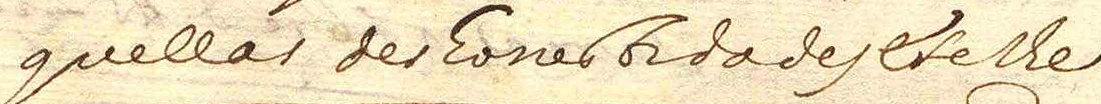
quellas deshonestidades e se lhe
